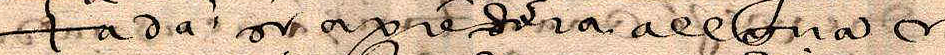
tada se aprēdera allguā ce
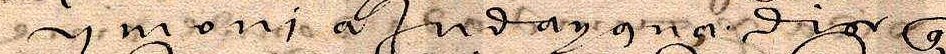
rjmonia Judayqua dise q̄
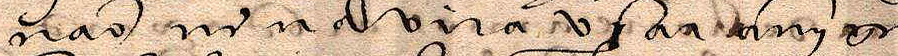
naõ nē na vira vsar a n̄ygē
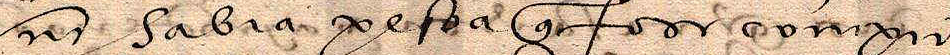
nē sabia pesoa q̄ fose comprē
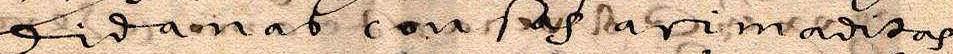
dida nas cousas açima ditas
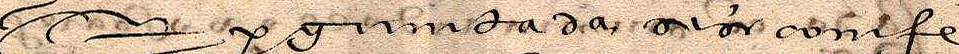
E ꝑgumtada se se comfe
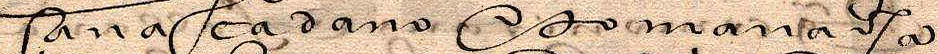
saua cadano e tomaua o sā
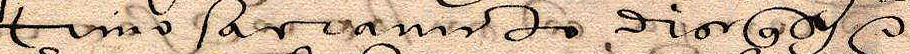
timo sacramēto dise q̄ sy e
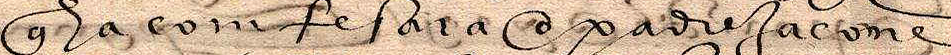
q̄ ha comfesara o padre Jacome
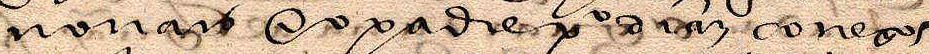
nouaes e o padre po diaz conegos
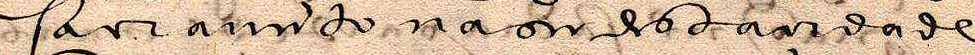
sacramēto na see desta çidade
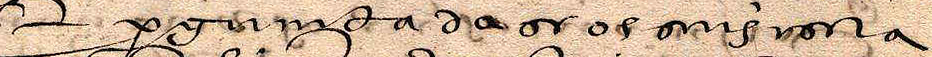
E ꝑgumtada se os seus escra
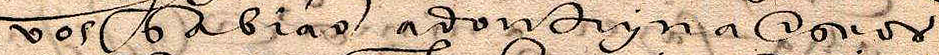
vos sabiaõ a doutryna e se os
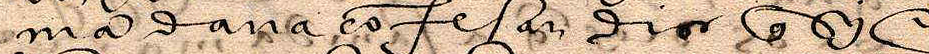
mādaua c̄ofesar dise q̄ sy e
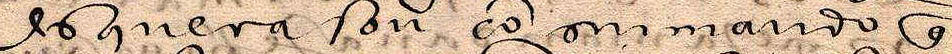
des que casou cō seu marido q̄
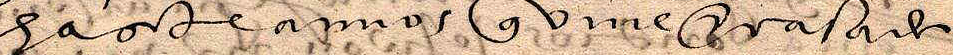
ha sete annos q̄ viue ē casa de
